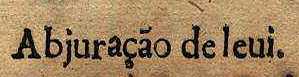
Abjuração de leui.
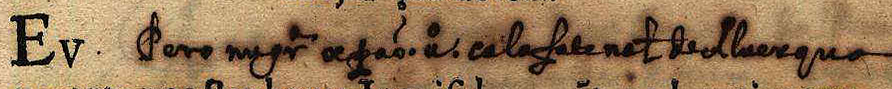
EV. Pero nugra xpaõ uo calafate nat de Aluerqua
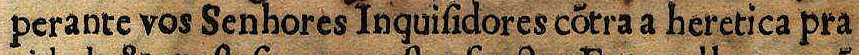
perante vos Senhores Inquisidores cōtra a heretica pra
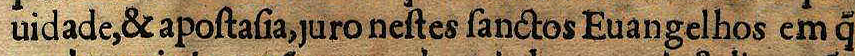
uidade, & apostasia, juro nestes sanctos Euangelhos em q̄
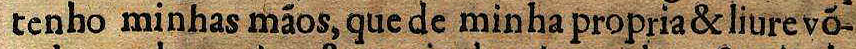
tenho minhas mãos, que de minha propria & liure vō
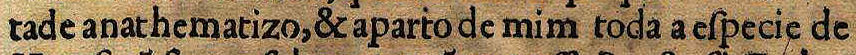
tade anathematizo, & aparto de mim toda a especie de
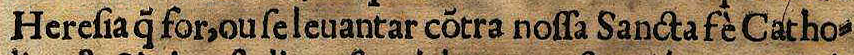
Heresia q̄ for, ou se leuantar cōtra nossa Sancta fè Catho
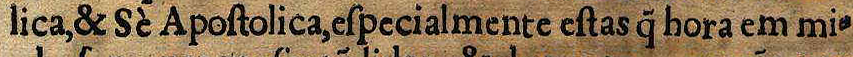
lica, & Sè Apostolica, especialmente estas q̄ hora em mi
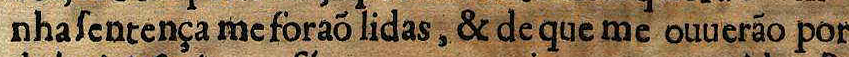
nha sentença me foraõ lidas, & de que me ouuerão por
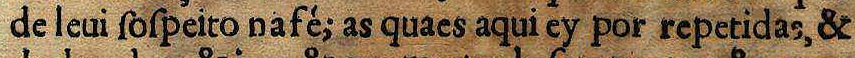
de leui sospeito na fé; as quaes aqui ey por repetidas, &
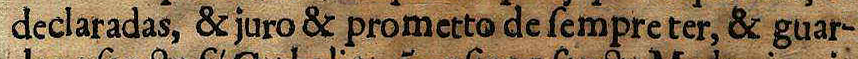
declaradas, & juro & prometto de sempre ter, & guar
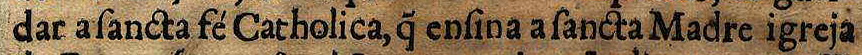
dar a sancta fé Catholica, q̄ ensina a sancta Madre igreja
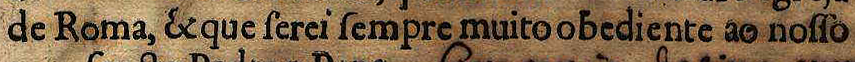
de Roma, & que serei sempre muito obediente ao nosso
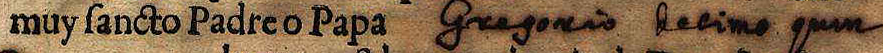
muy sancto Padre o Papa Gregorio decimo quin
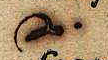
to.
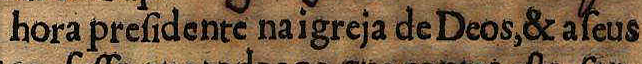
hora presidente na igreja de Deos, & a seus
